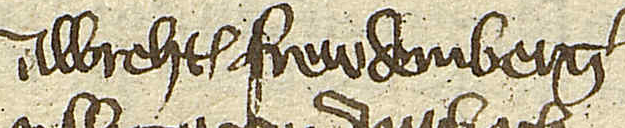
Albreht* frewdemberg*
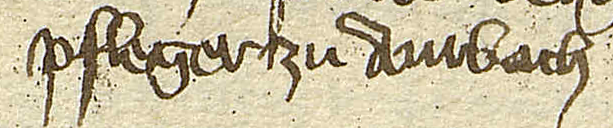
pfleger cʒu Aurbach
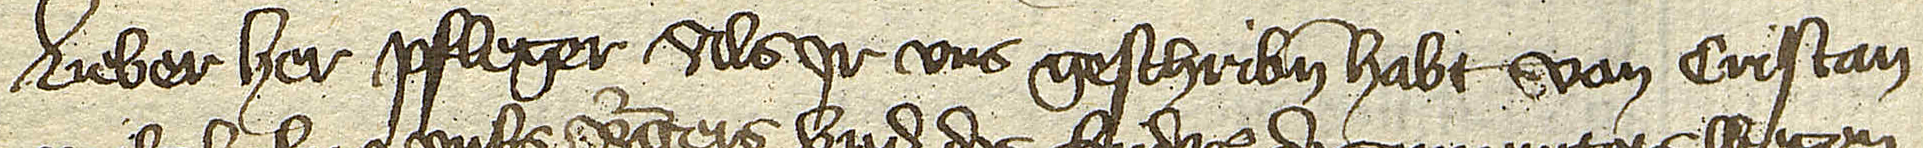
Lieber her Pfleger / Als Ir vns geſchribn* habt von Criſtan
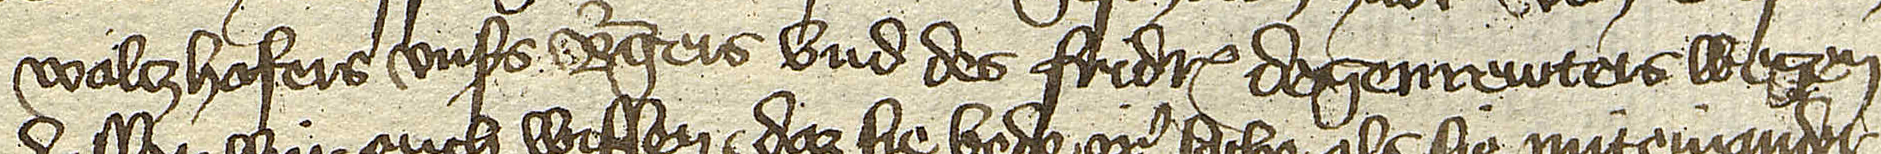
wolcʒhofers vnſ*s B*gers vnd des fridr* degenrewters wegen
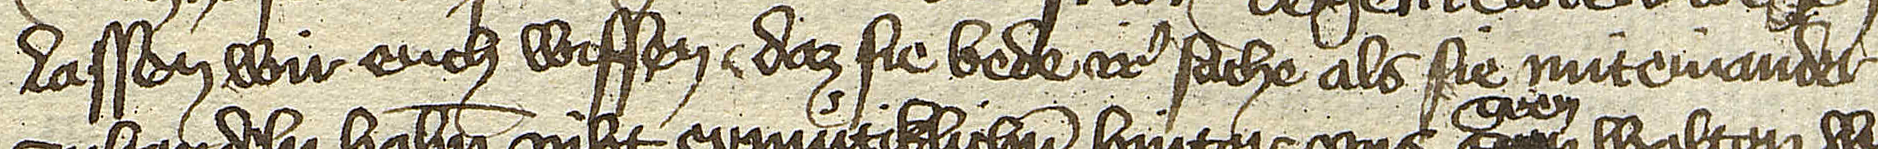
laſſen wir euch wiſſen / daʒ ſie bede ir* ſache als ſie miteinander
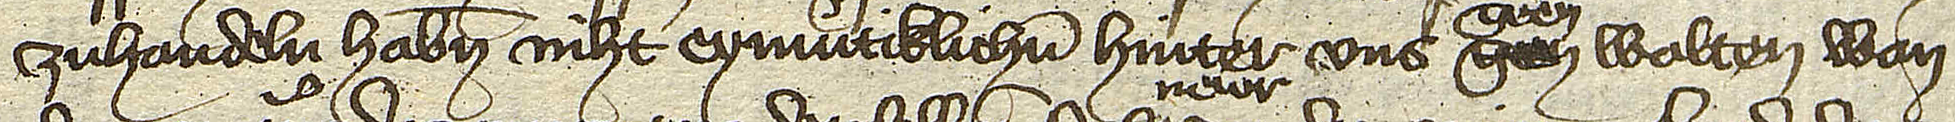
cʒuhandeln habn* niht eymütiklichn* hinter vns gen wolten wan*
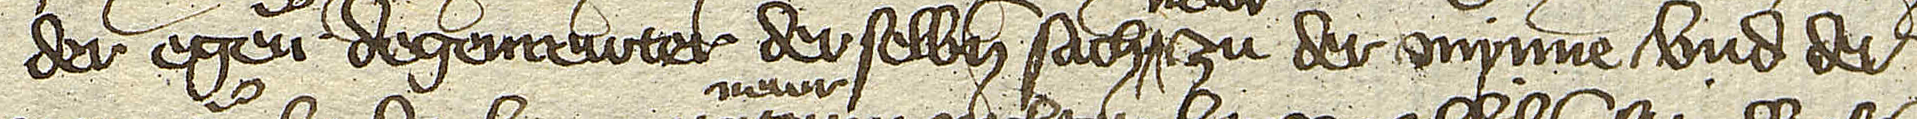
der egen* . degenrewter derſelbn* ſach cʒu der mynne / vnd der
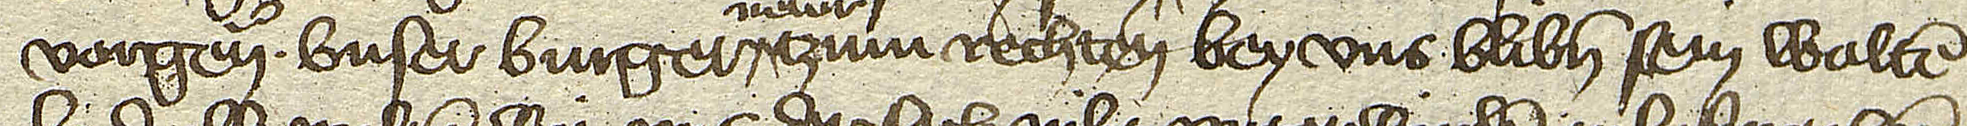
vorgen* . vnſer burger cʒum rechten bey vns blibn* ſein wolte*
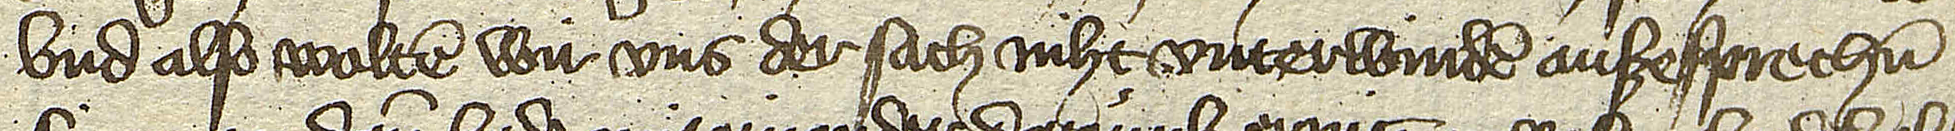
vnd alſo wolte* wir vns der ſach niht vnterwinde* auſʒeſprechn*
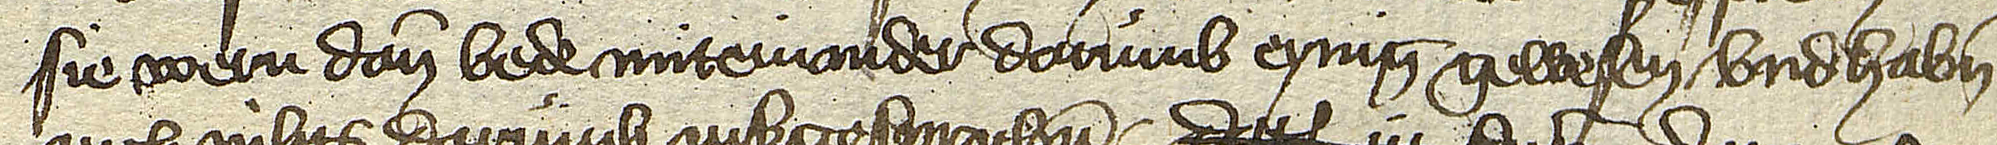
ſie wern dan* bede miteinander darümb eynig geweſen / vnd habn*
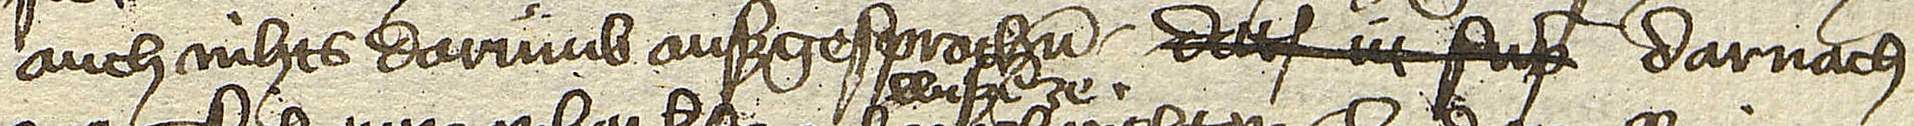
auch nihts darümb auſʒgeſprochn* / dat* ut ſup* darnach
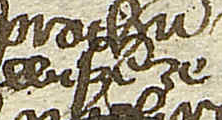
wiſʒe* ʒe
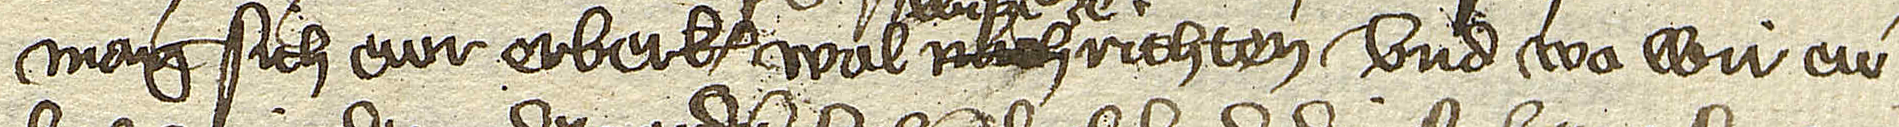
mag ſich ewr erberk* wol nach richten / vnd wo wir ew
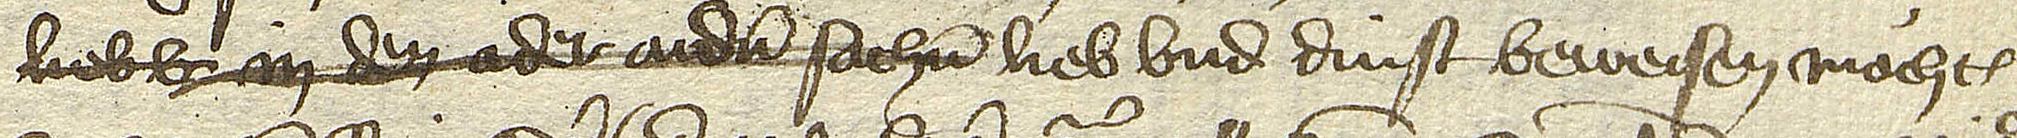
lieb v in den oder andn* ſachn* lieb vnd dinſt beweiſen möcht*
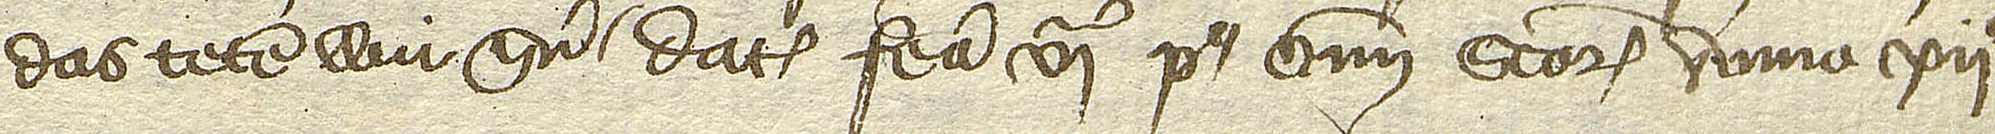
das tete* wir gn* / dat* fea* vi* p* Omi* Sco* Anno xii*
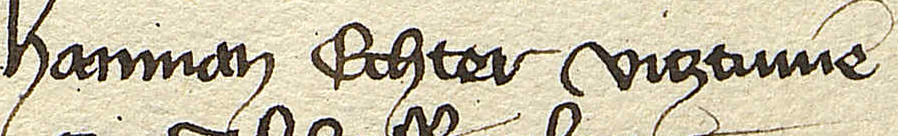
hanman Echter victume*
